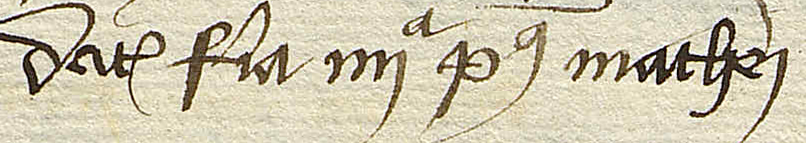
Dat* f*ia iiii* p* mathei
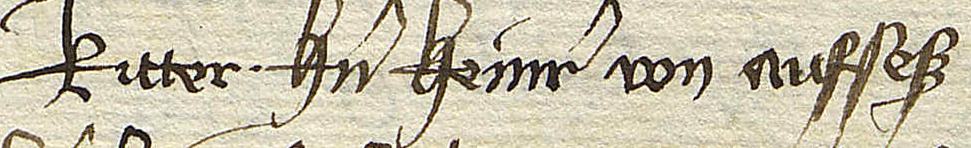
Ritter . Hn* Heinr* von aufſeſʒ
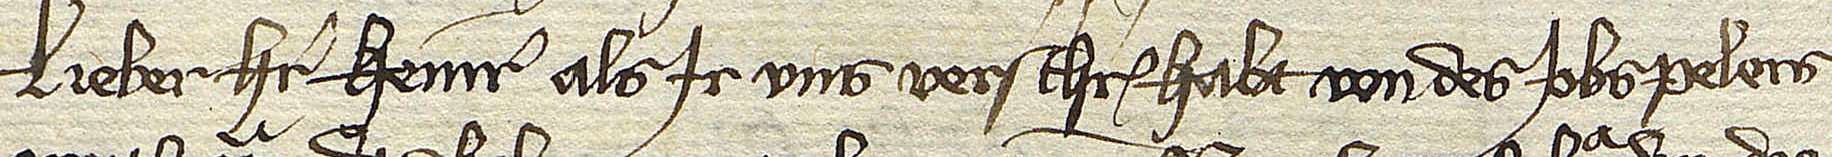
Lieber hr* heinr* als Ir vns verſchr* habt von des Iobs Pele%s
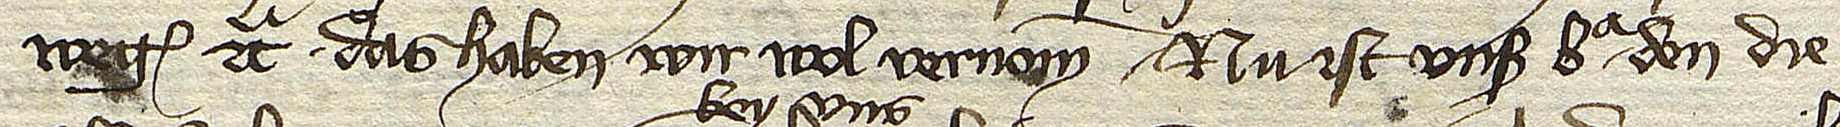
weg* ec* . das haben wir wol vernom* / Nu iſt vnſ* b* / den die
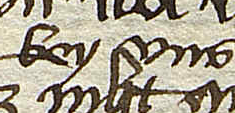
bey vns
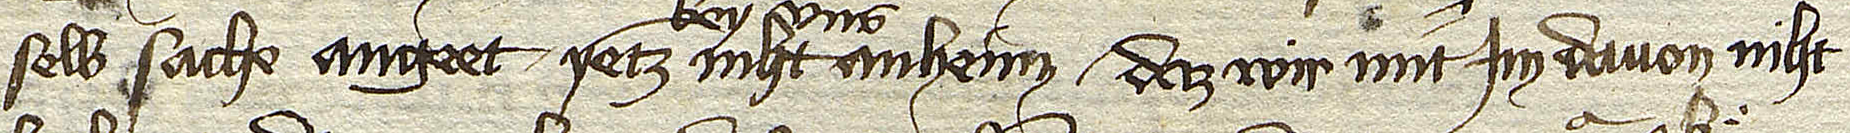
ſelb ſache angeet / yecʒ niht anheim / daʒ wir mit Im dauon niht
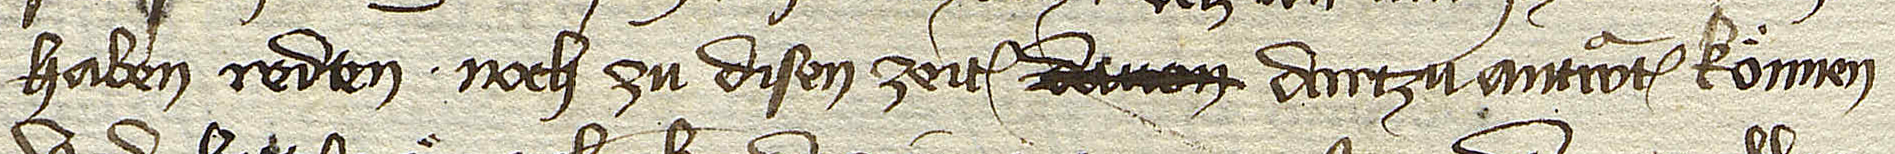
haben reden . noch ʒu diſsen ʒeit* dauon darcʒu antw*t* können
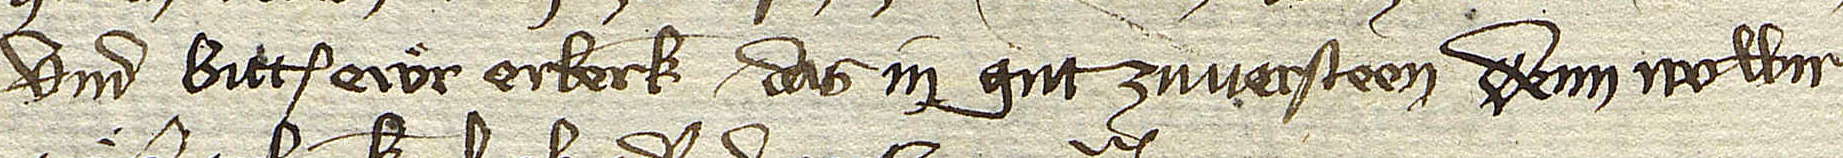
Vnd bitt* ewr erberk* / das in gut ʒuuerſteen Denn wo wir
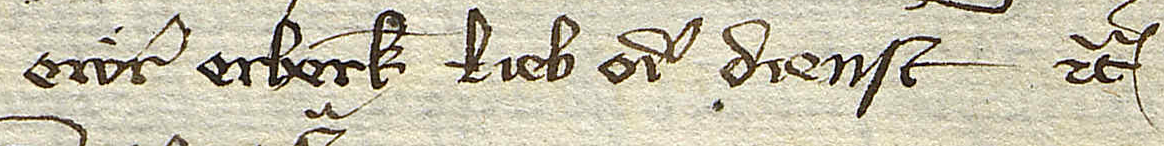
ewr* erberk* lieb od* dienſt ec*
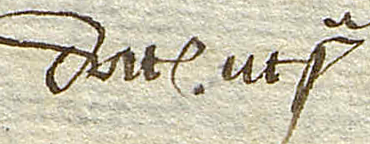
Dat* ut ſ*
